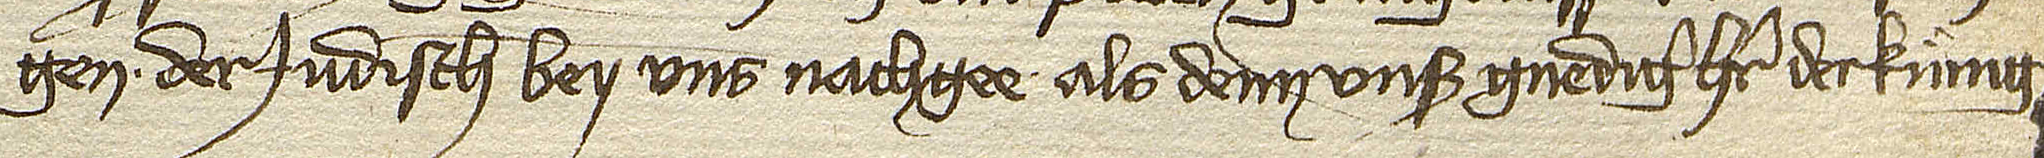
gen . der Iudiſch* bey vns nachgee . als denn vnſ* gnedig* hr* der künig
